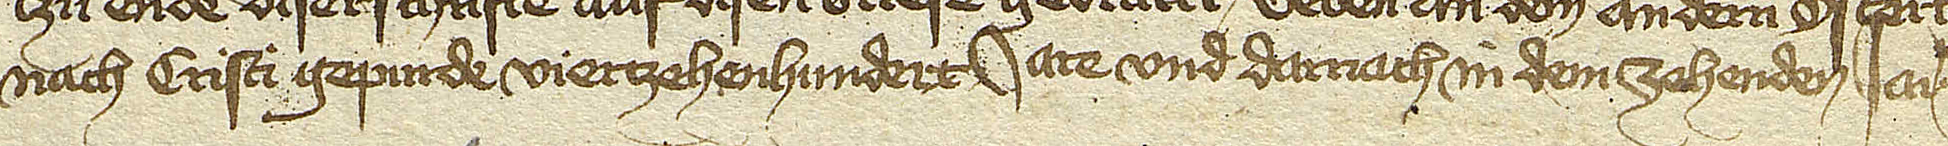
nach Criſti gepurde viercʒehenhundert Iare vnd darnach in dem cʒehenden Iar
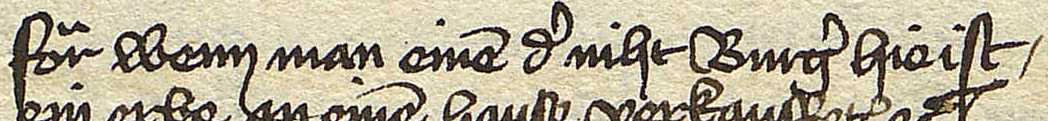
for* wenn man eine* d* niht burg* hie iſt /
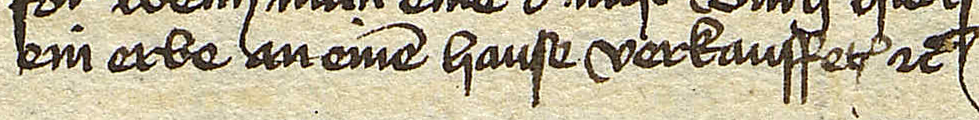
ein erbe an eine* hauſe verkauffet ec*
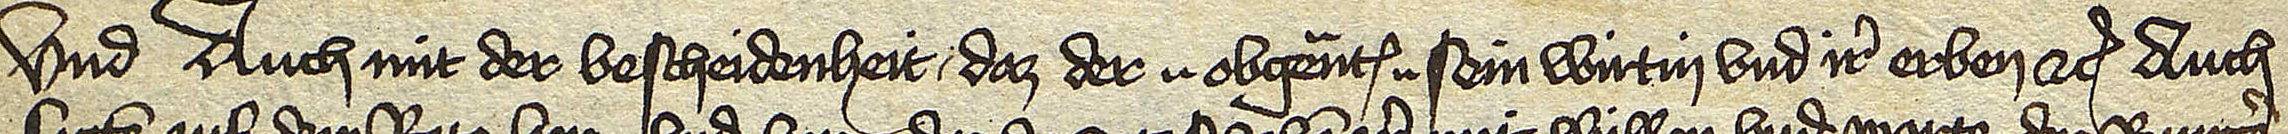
Vnd Auch mit der beſcheidenheit / daʒ der ~ obgen*t* ~ ſein wirtin vnd ir* erben ec* Auch
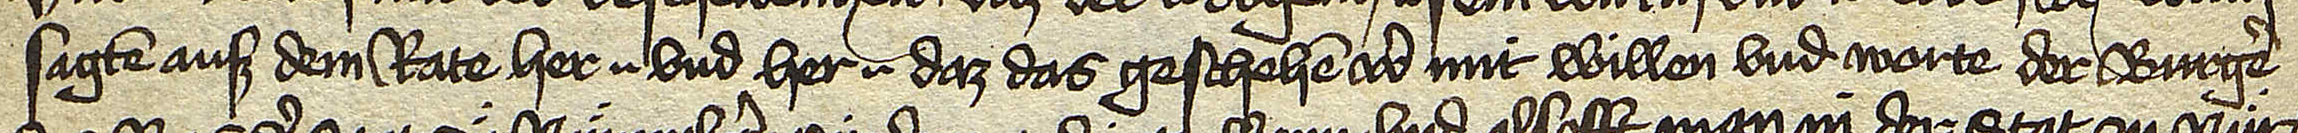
ſagte* auſʒ dem Rate her ~ vnd her ~ daʒ das geſchehe* w* mit willen vnd worte der Burge*
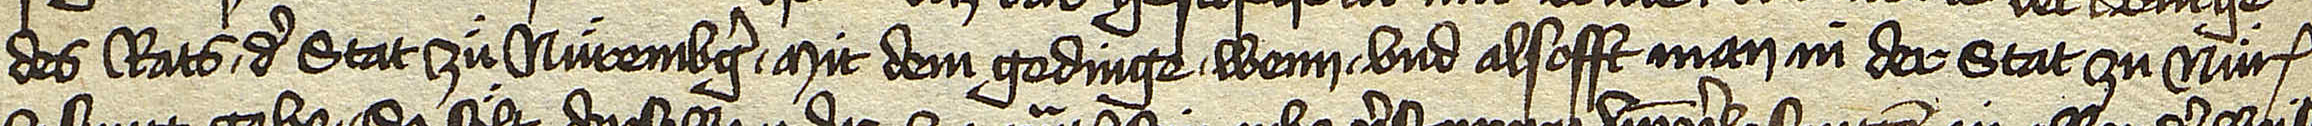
des Rats / d* Stat cʒü Nürembg* / Mit dem gedinge / wenn / vnd alſofft man in der Stat cʒu Nür*
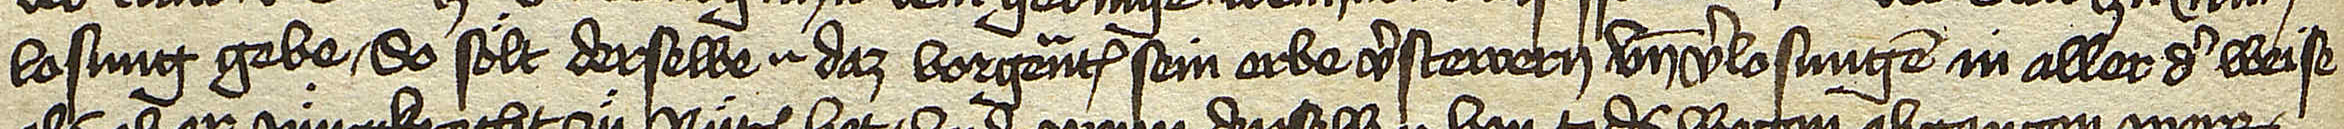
loſung gebe / So ſölt derſelbe ~ daʒ vorgen*t* ſein erbe v*ſtewern / vn* v*loſunge* in aller d* weiſe
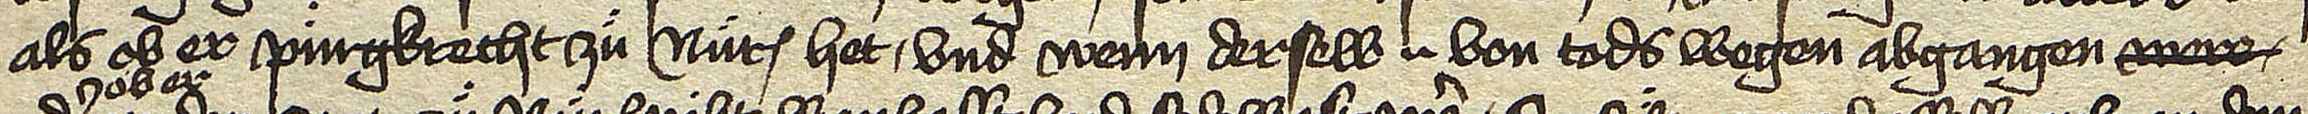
als ob er pürgkrecht cʒü Nür* het / vnd wenn derſelb ~ von tods wegen abgangen were /
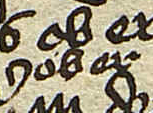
ob er
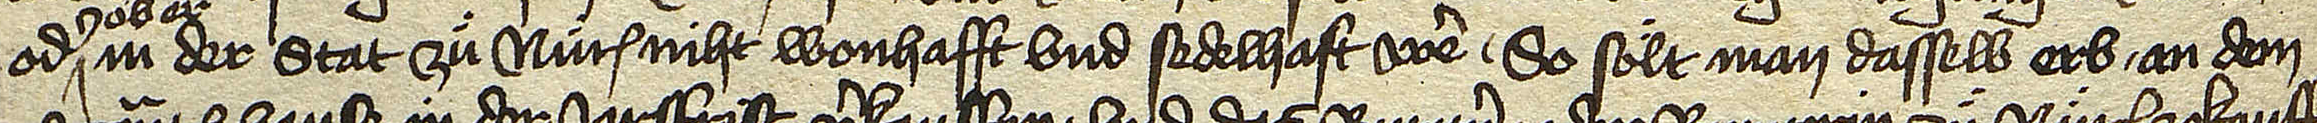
od* in der Stat cʒü Nür* niht wonhafft vnd ſedelhaft we* / So ſölt man daſſelb erb / an dem
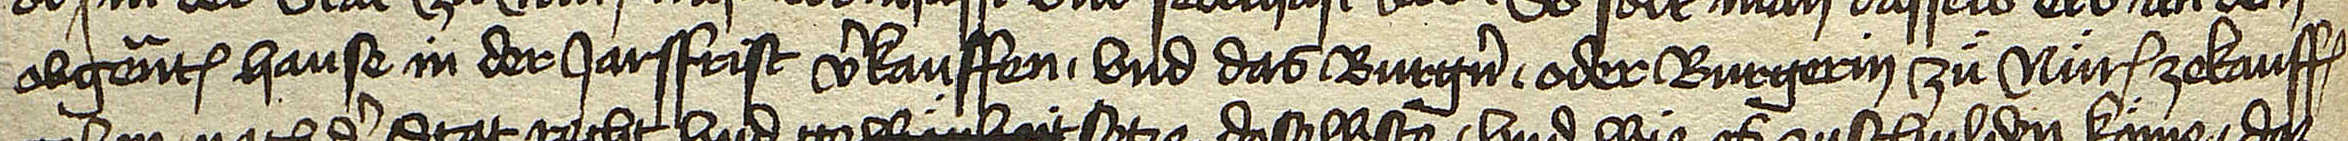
obgen*t* hauſe in der Iarſfriſt v*kauffen / vnd das Burgn* / oder Burgerin cʒü Nür* ʒekauff*
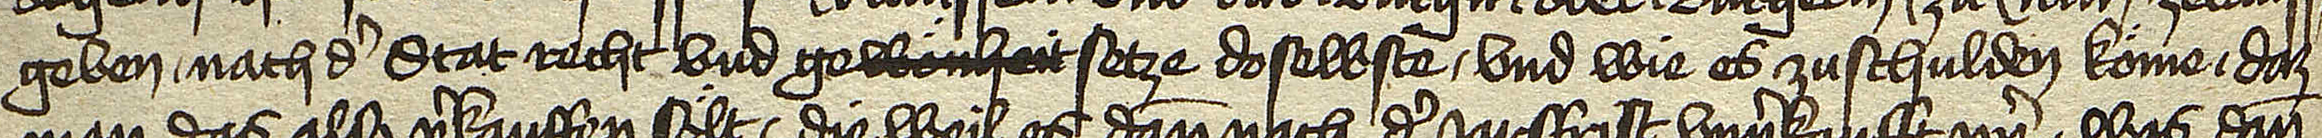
geben / nach d* Stat recht vnd gewönheitſetʒe doſelbſte / vnd wie es ʒuſchulden köme / daʒ
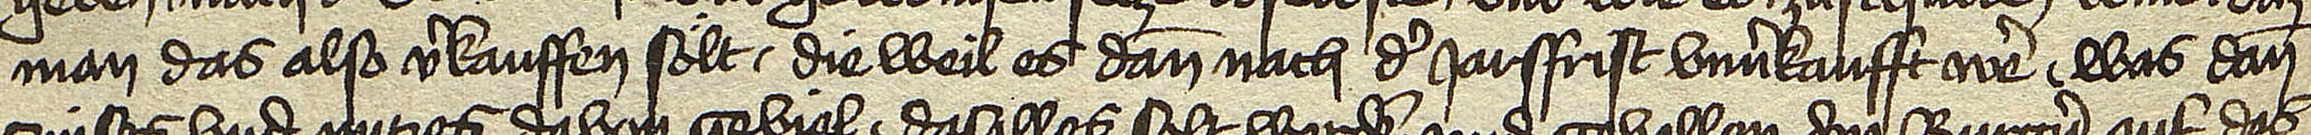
man das alſo v*kauffen ſölt / die weil es dan* nach d* Iarſfriſt vnu*kaufft we* / was dan*
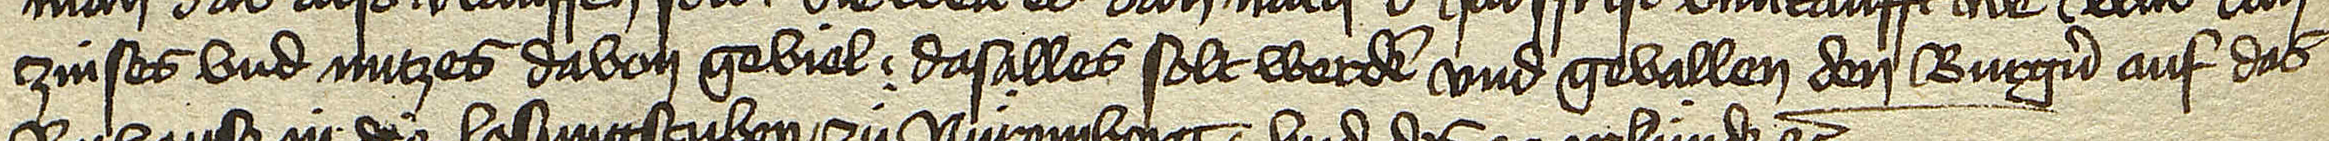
cʒinſes vnd nutʒes davon geviel / daſalles ſolt werde* vnd gevallen den Burgn* auf das
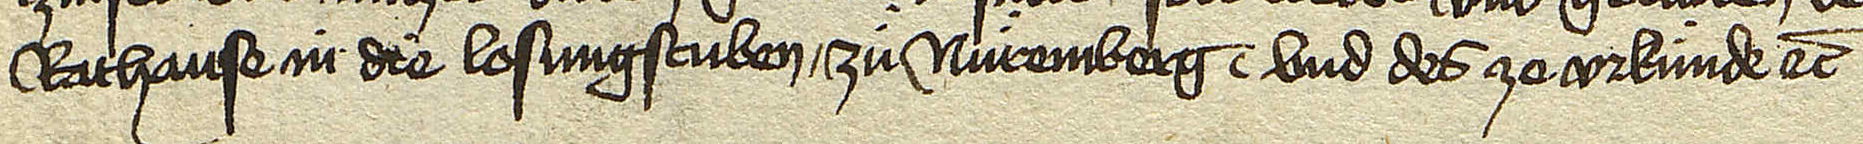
Rathauſe in die loſungſtuben / cʒü Nüremberg / vnd des cʒe vrkünde ec*
